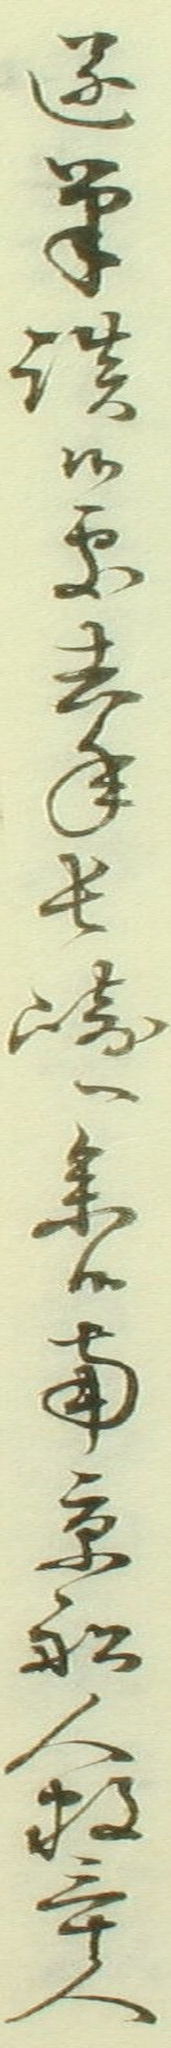遂筆談候処去年長崎へ参候南京船人数三十人
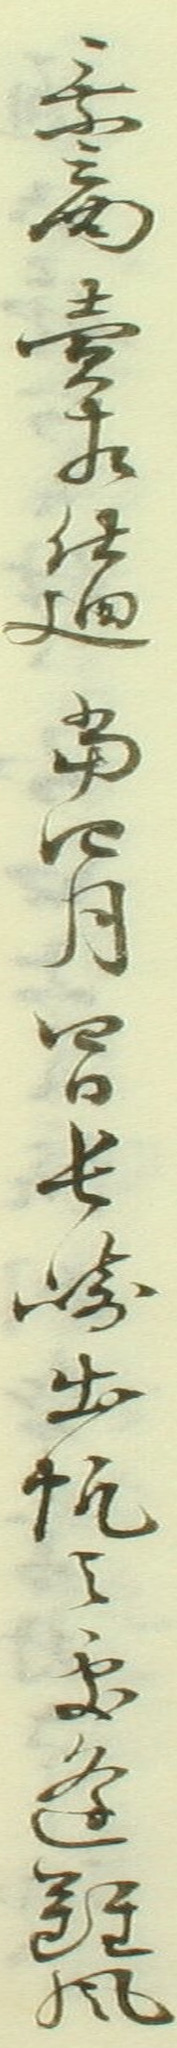乗商売相仕廻当四月四日長崎出航之処逢難風
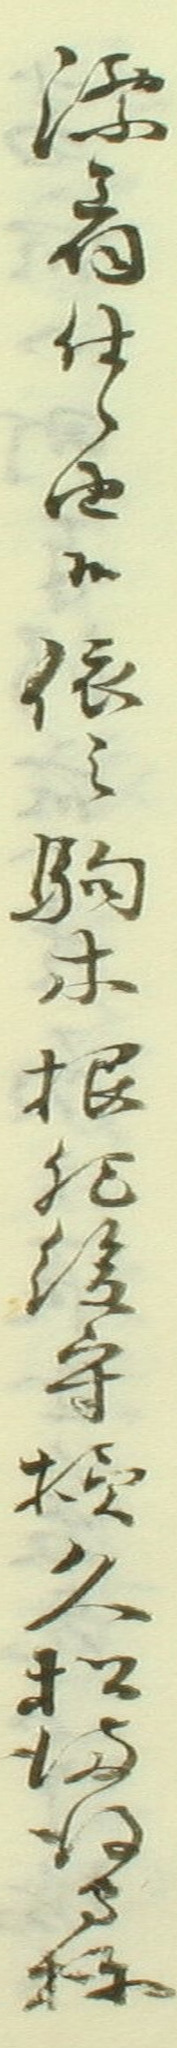漂着仕候由候依之駒木根肥後守様久松備後守様
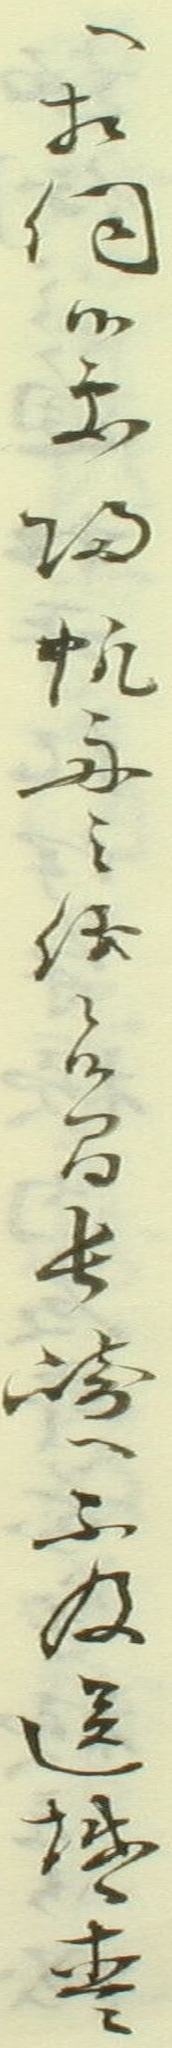へ相伺候処帰帆舟之儀に候間長崎へ不及送越候直に
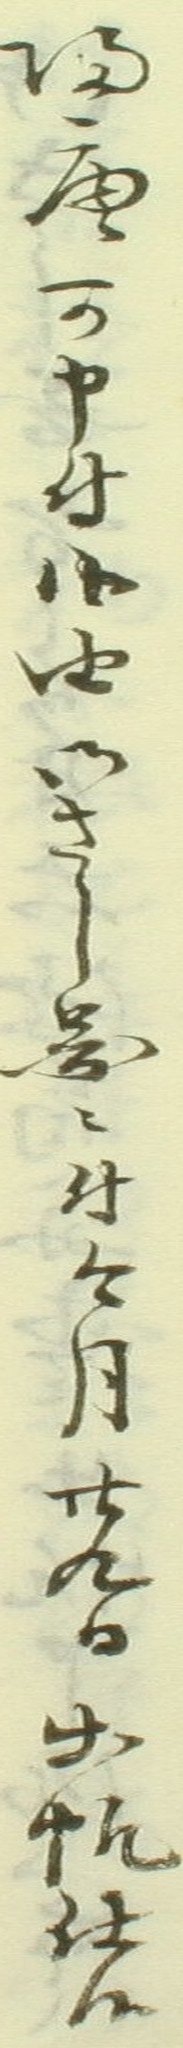帰唐可申付候由御さし図に付今月廿九日出帆仕候
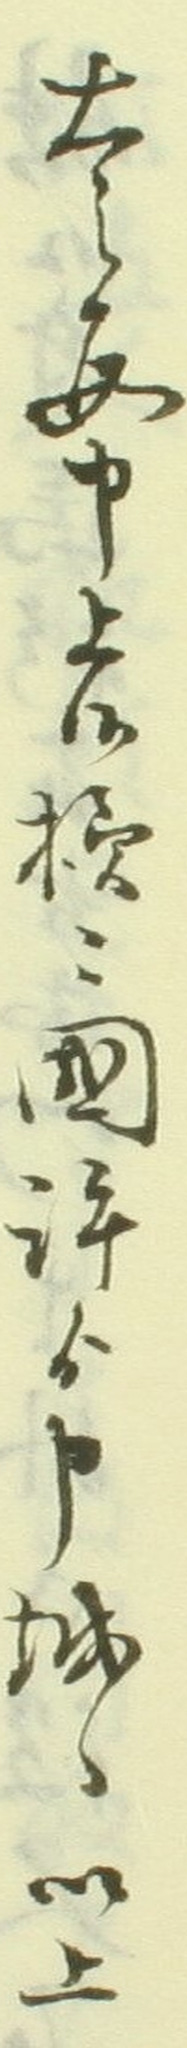右之段申上候様に国許ゟ申越候以上
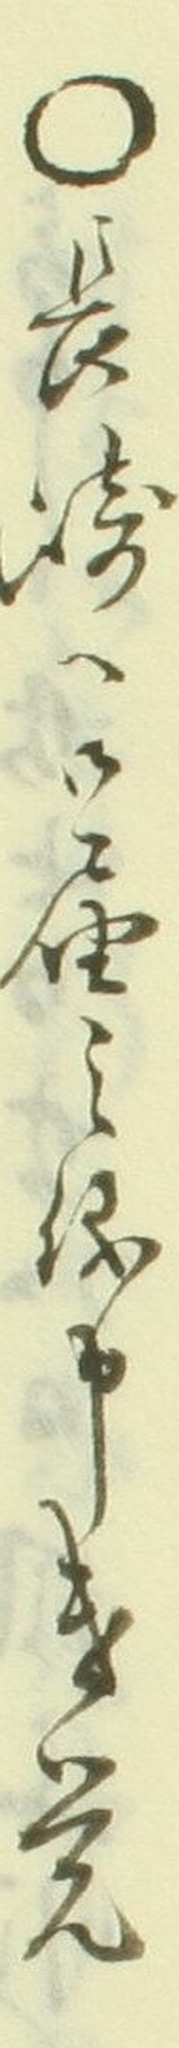〇長崎へ御届之儀申遣覚
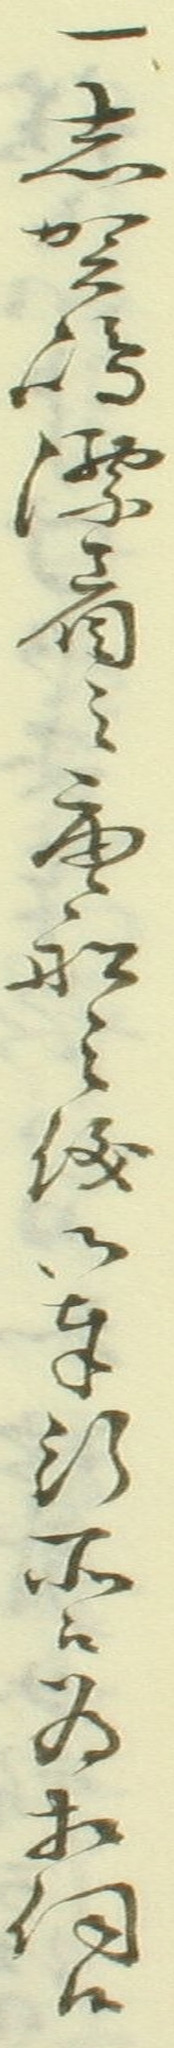一志賀島漂着之唐船之儀御奉行所え為相伺候
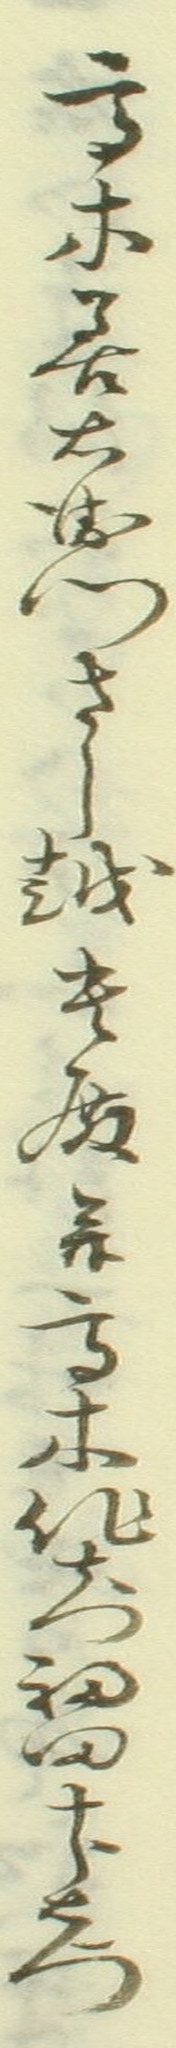高木善右衛門さし越貴殿并高木作右衛門福田十郎右衛門
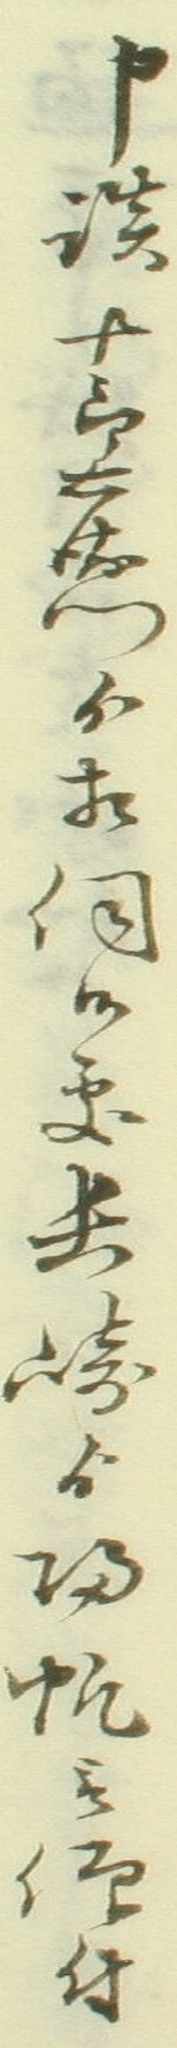申談十郎右衛門ゟ相伺候処長崎ゟ帰帆被仰付
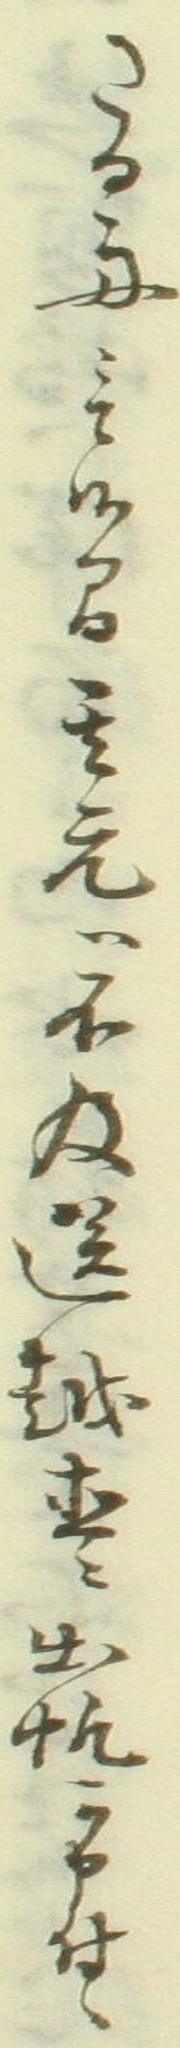たる舟にて候間其元は不及送越直に出帆可申付候
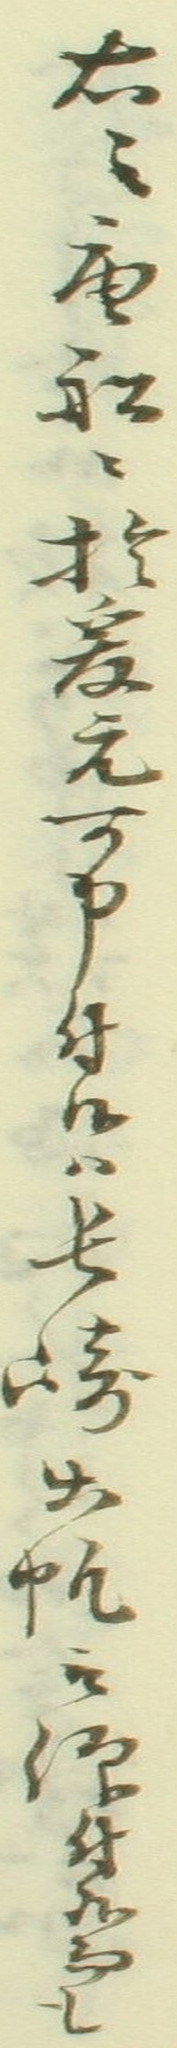右之唐船に於爰元可申付候は長崎出帆被仰付候而も
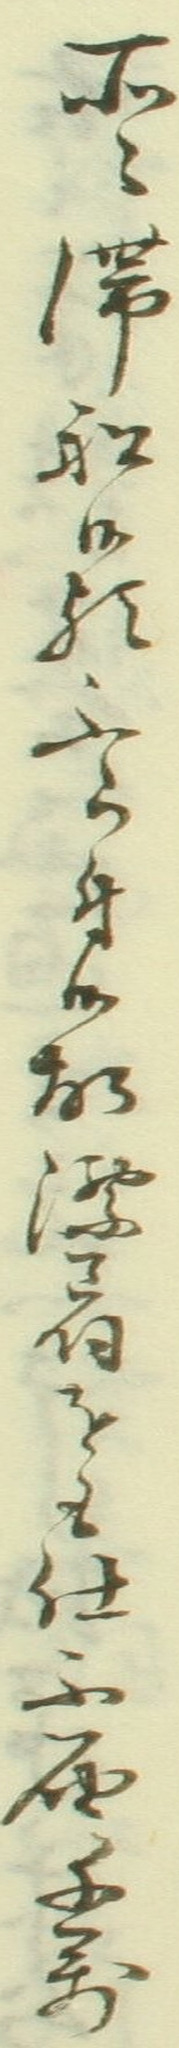所々滞船候歟ふら付候故漂着をも仕不届千万
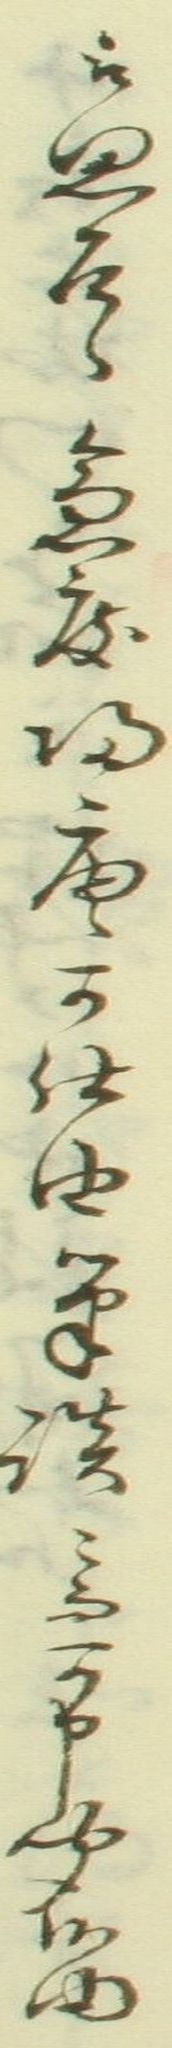被思召候急度帰唐可仕由筆談に而可申聞候由

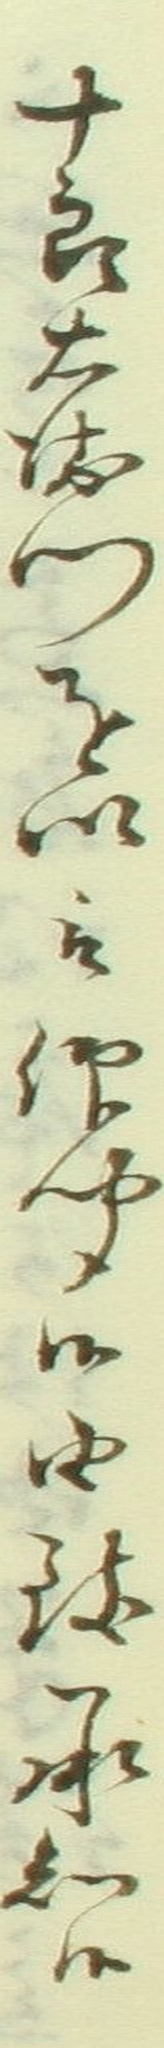十郎右衛門を以被仰聞候由致承知候
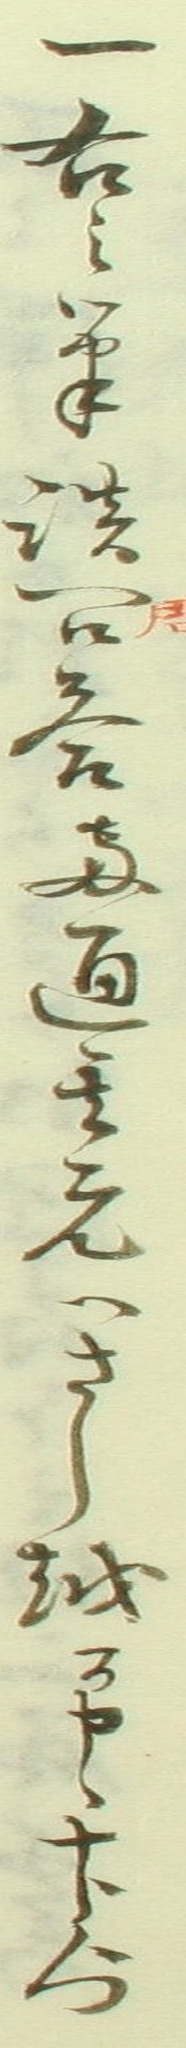一右之筆談問答両通其元へさし越可申候十郎右衛門
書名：異国船漂着記
